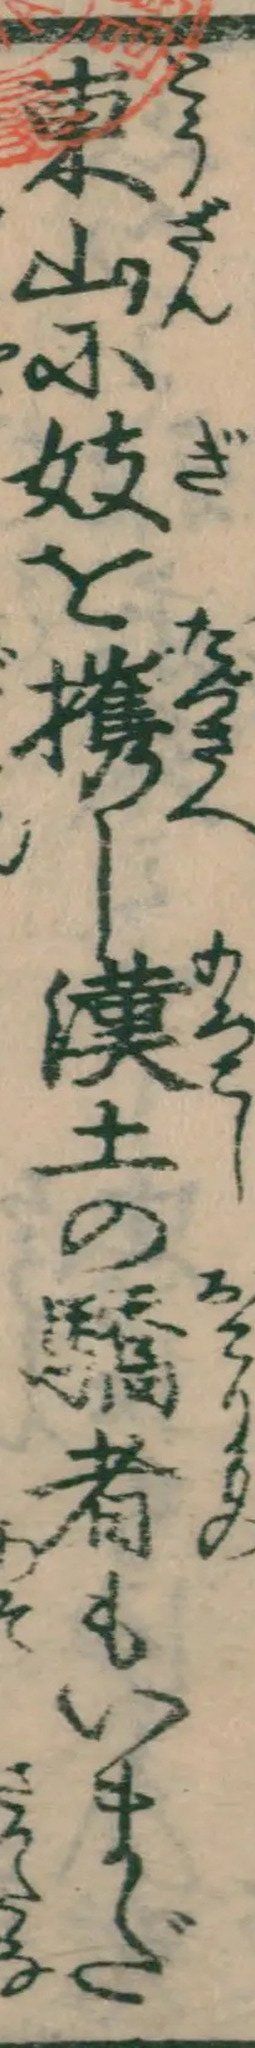東山に妓を携し漢土の驕者もいまだ
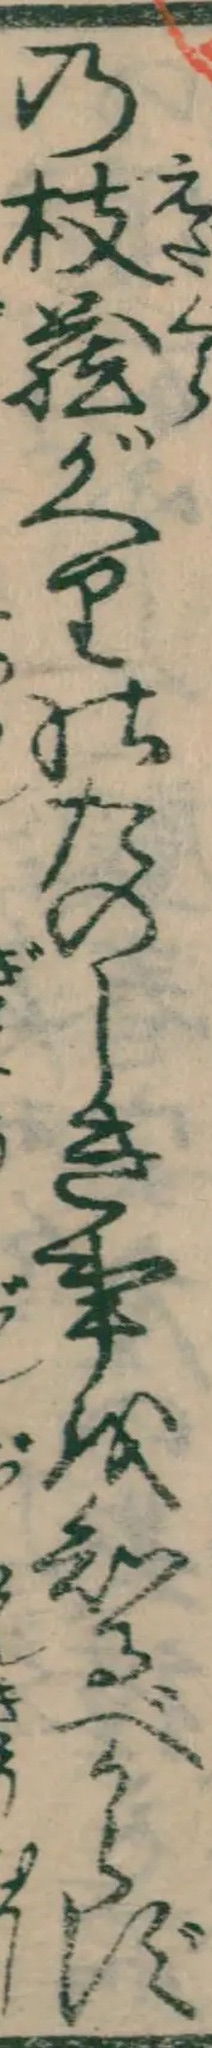の枝蔵がへりのたのしき事を知るべからず
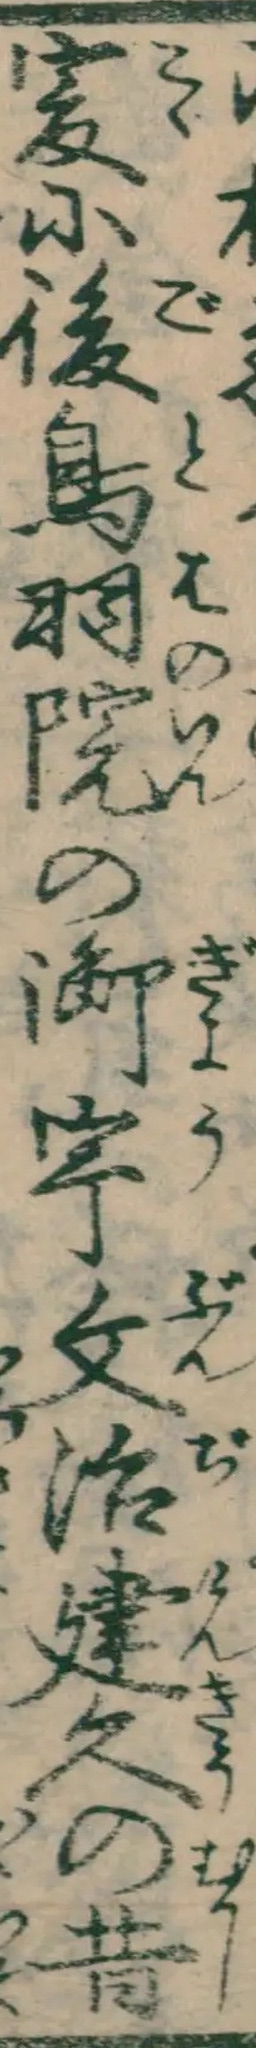爰に後鳥羽院の御宇文治建久の昔
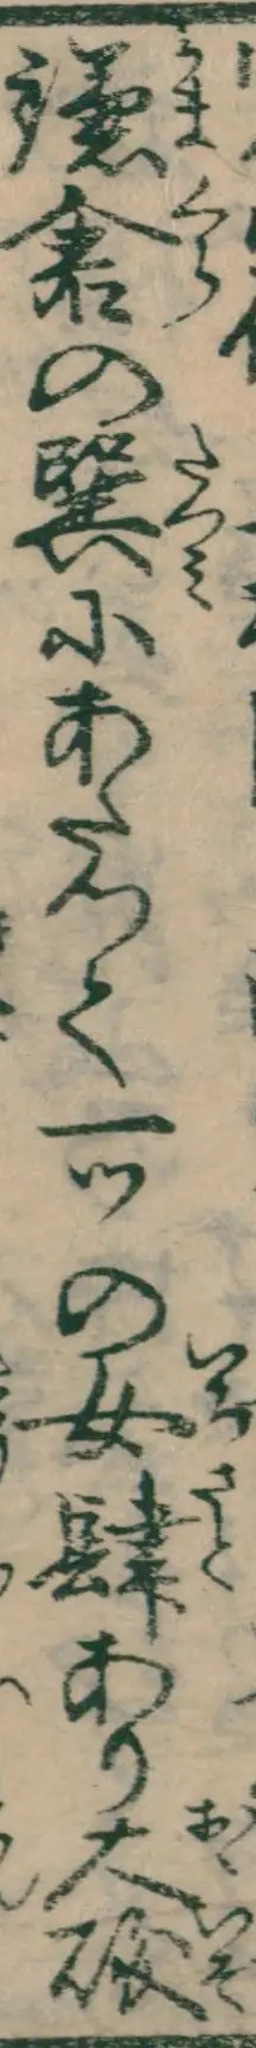鎌倉の巽にあたつて一つの女肆あり大磯
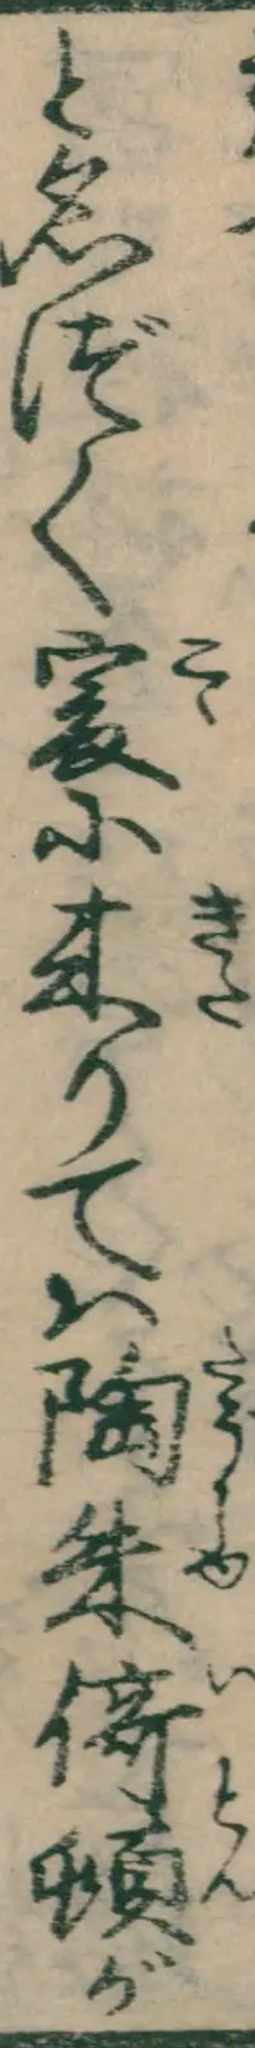と名づく爰に来りては陶朱倚頓が

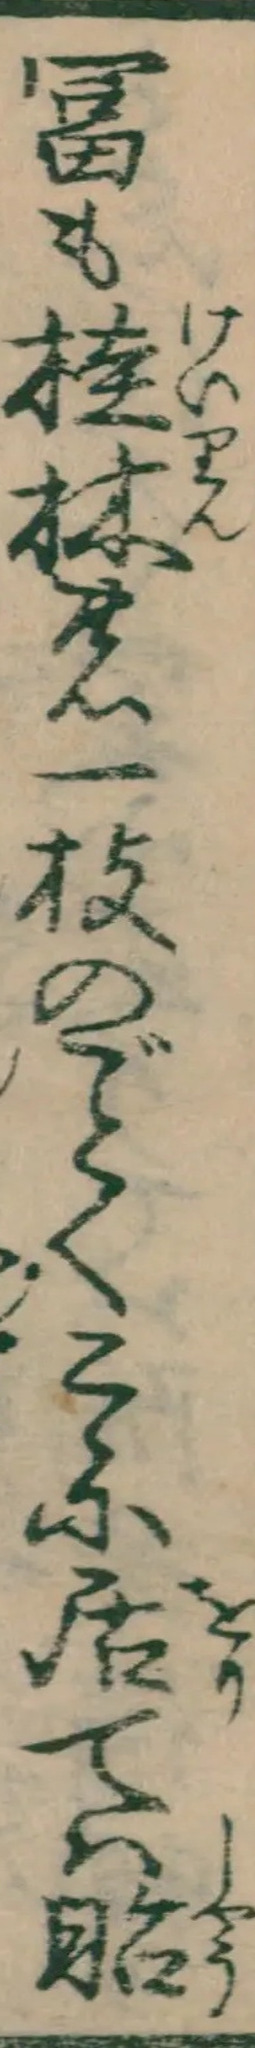富も桂林の一枝のごとくこゝに居ては貽
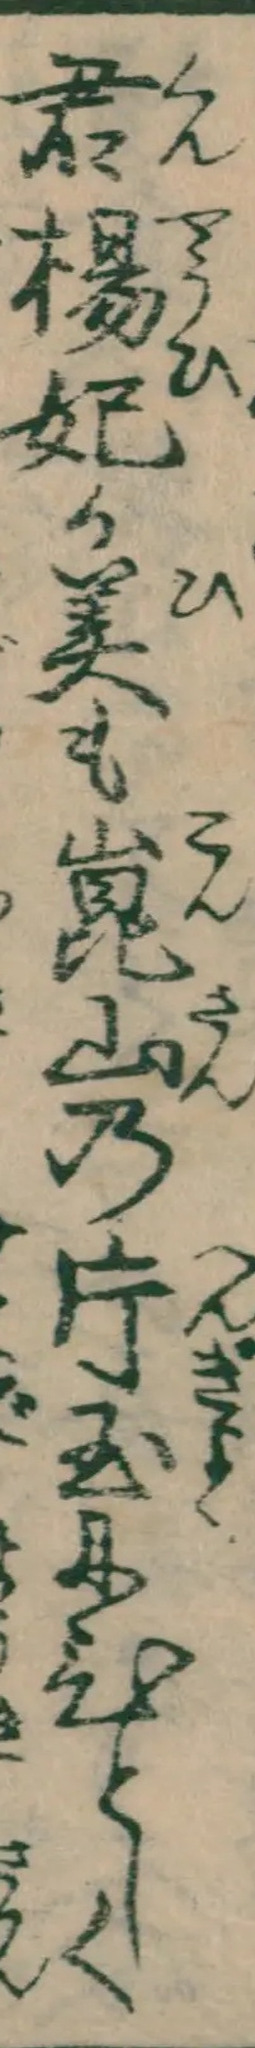君楊妃か美も崑山の片玉にひとしく
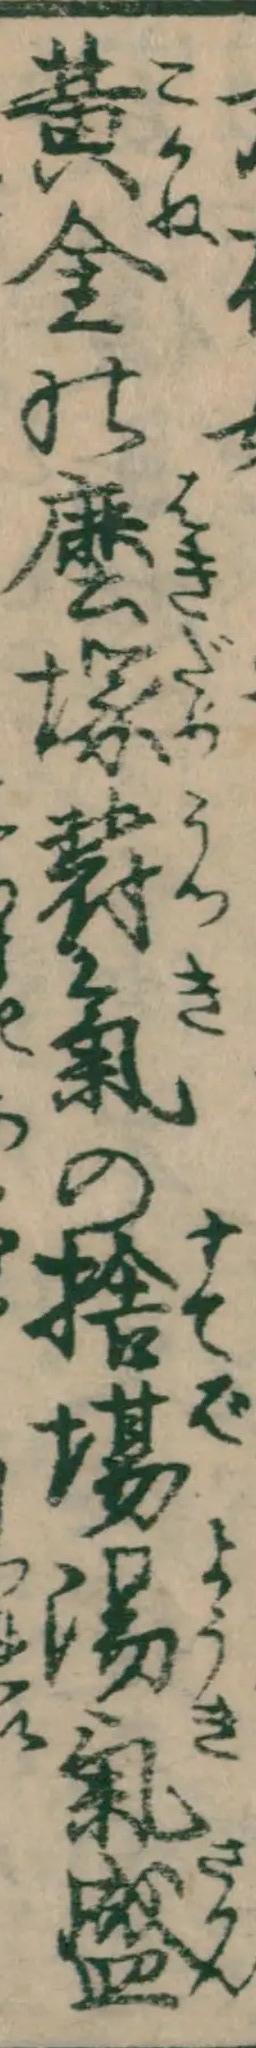黄金の塵塚欝気の捨場湯気盛
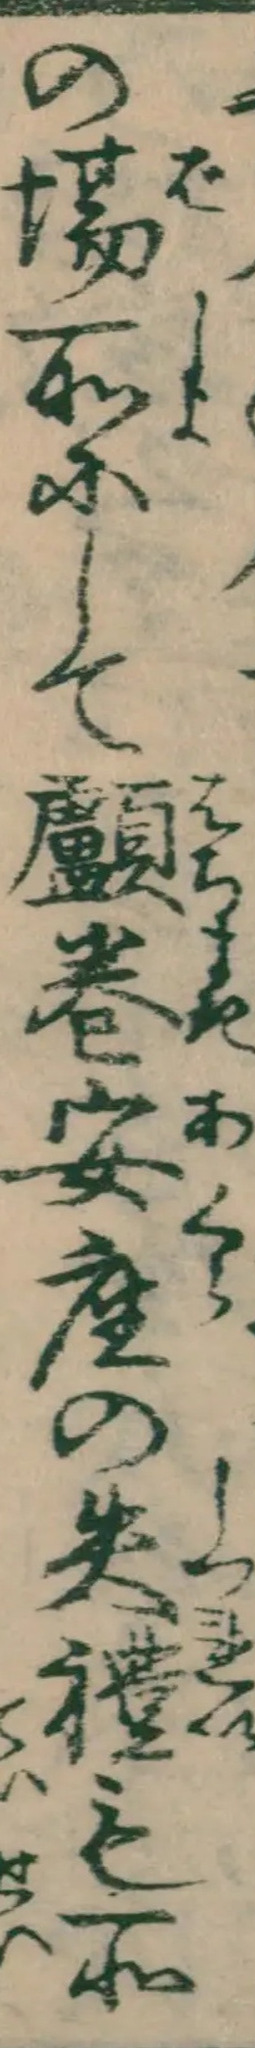の場所にして顱巻安座の失礼も所
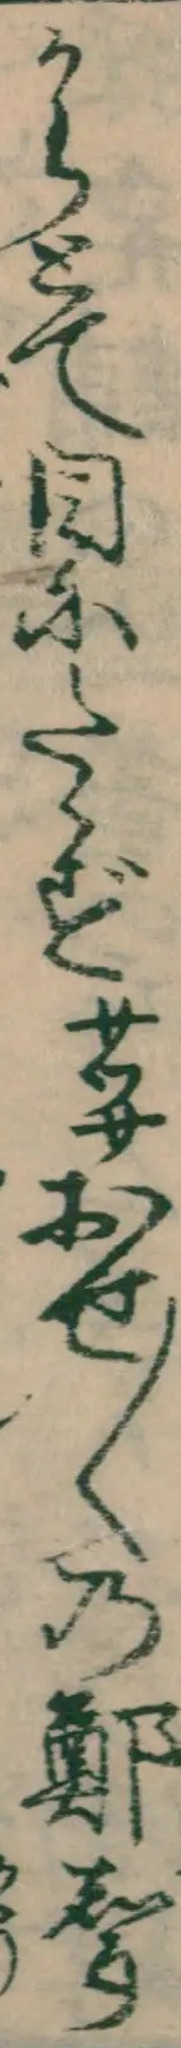からとて目にたゝずサツサおせ〳〵の鄭声
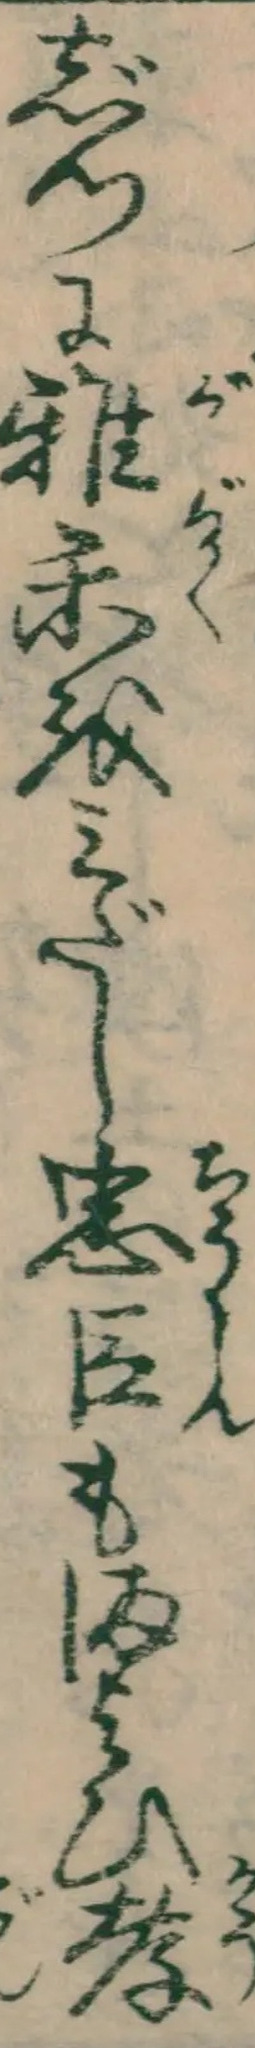じつに雅楽をみだし忠臣もまよひ孝
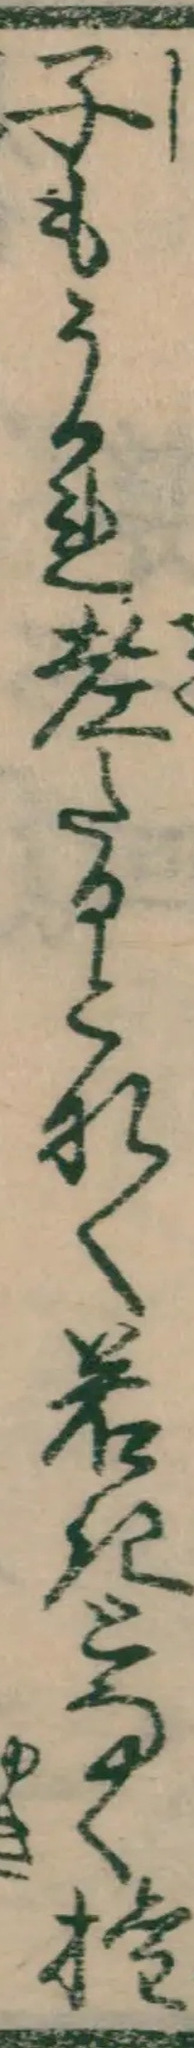子もうかれ老たるとなく若きとなく権
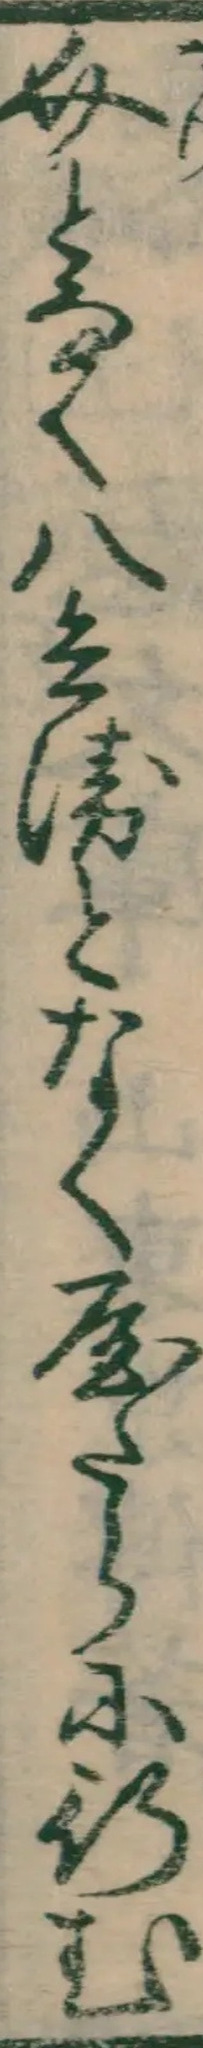介となく八兵衛となくやたらに行む
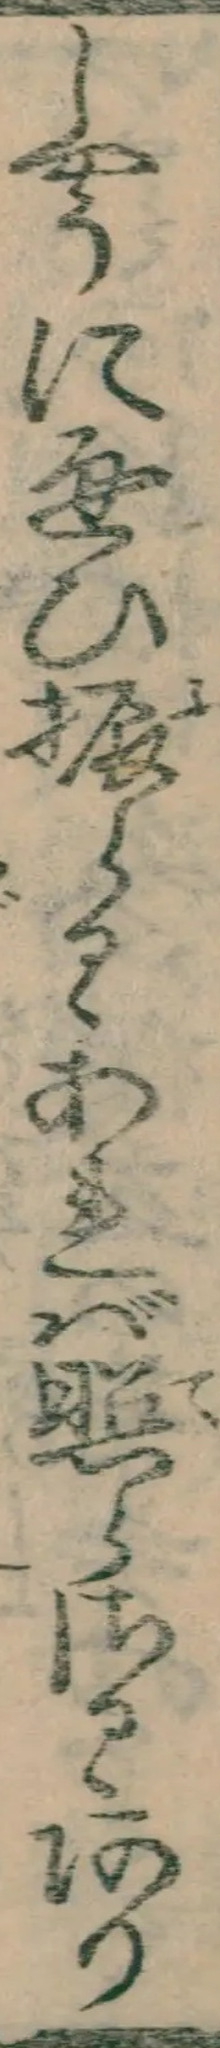しやうに通ひ振らるゝあれば照らさるゝあり
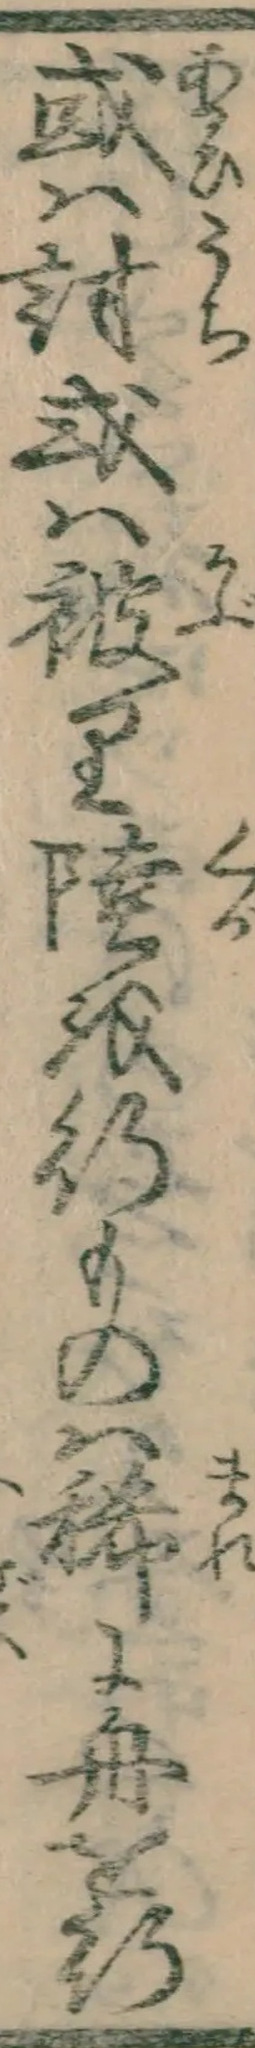或は討或は被り陸を行ものは稀に舟を行
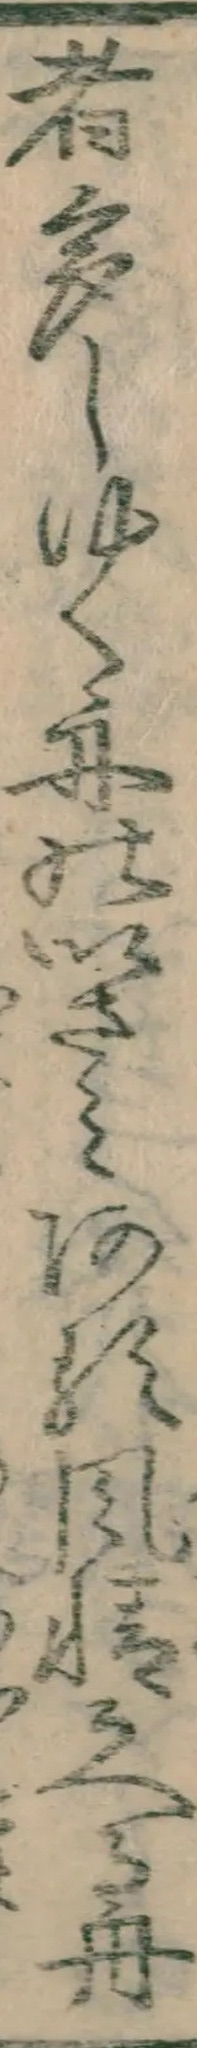者多しゆく舟のいさみある風情かへる舟
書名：教訓読本：大礒風俗仕懸文庫
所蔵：国立国会図書館 National Diet Library, JAPAN
